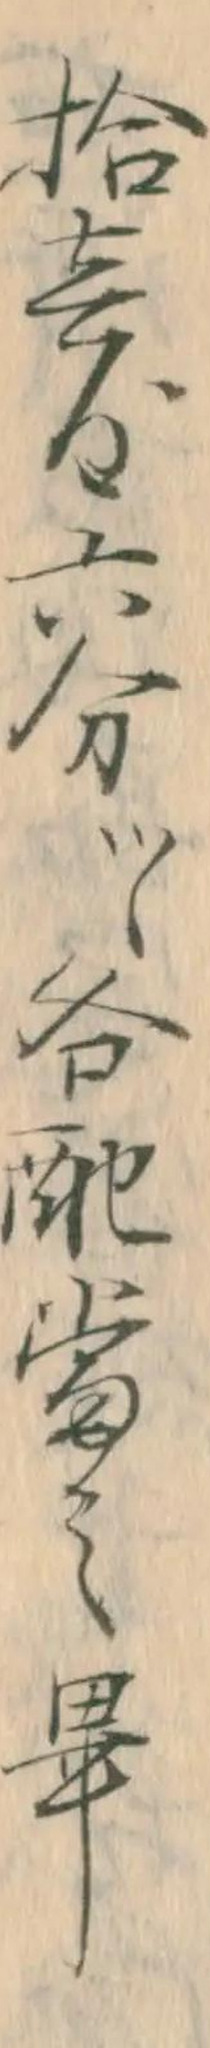拾壱匁六分ツヽ各配当之畢
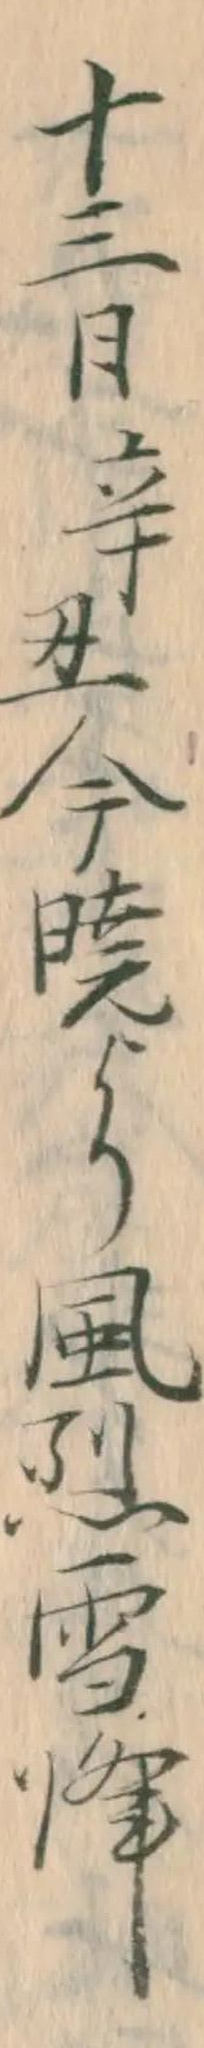十三日辛丑今暁より風烈雪降
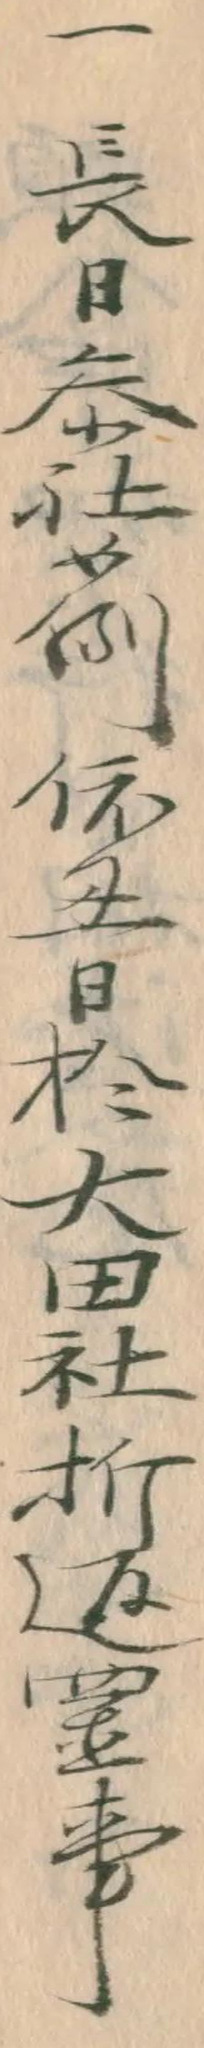一長日参社如例依丑日於大田社折返置事
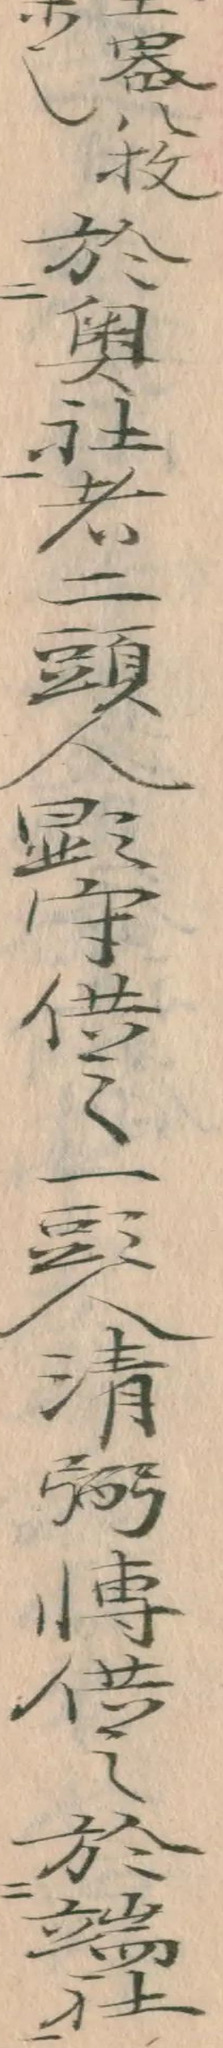土器八枚等也於奥社者二頭人顕守供之一頭人清弼傳供之於端社
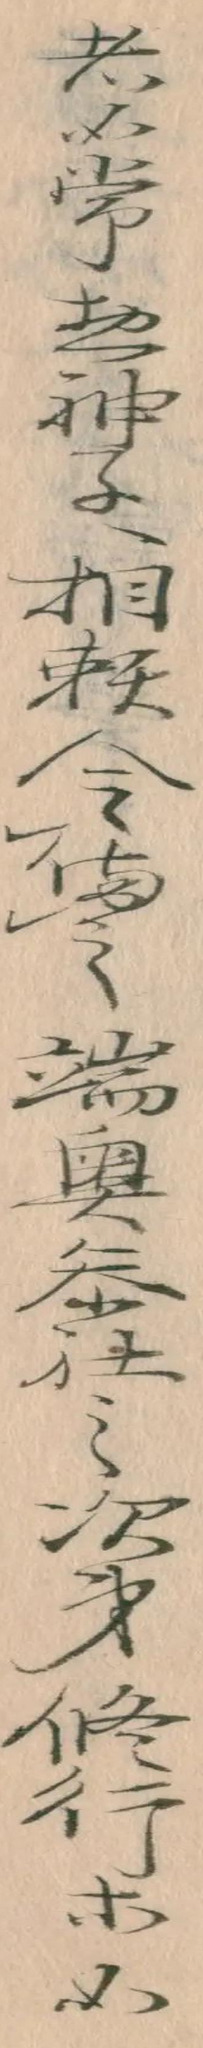者如常惣神子へ相頼令備之端奥参社之次第修行等如
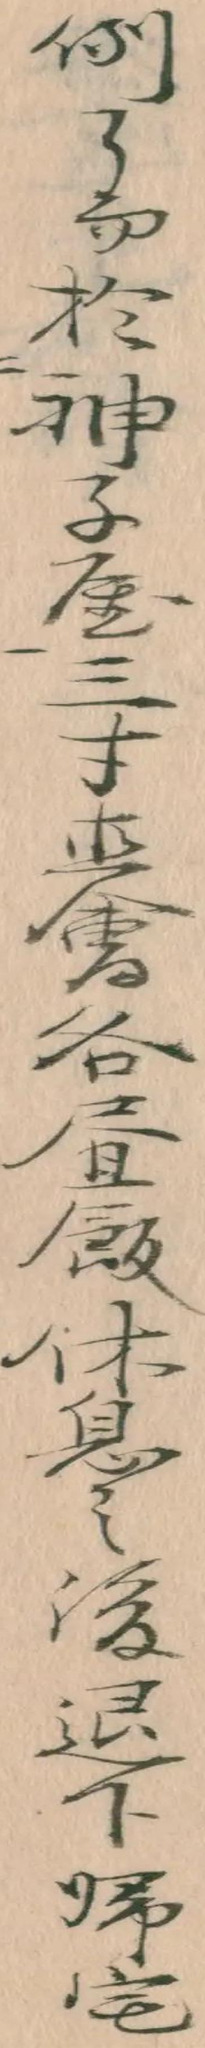例了而於神子屋三寸直會各昼飯休息之後退下帰宅
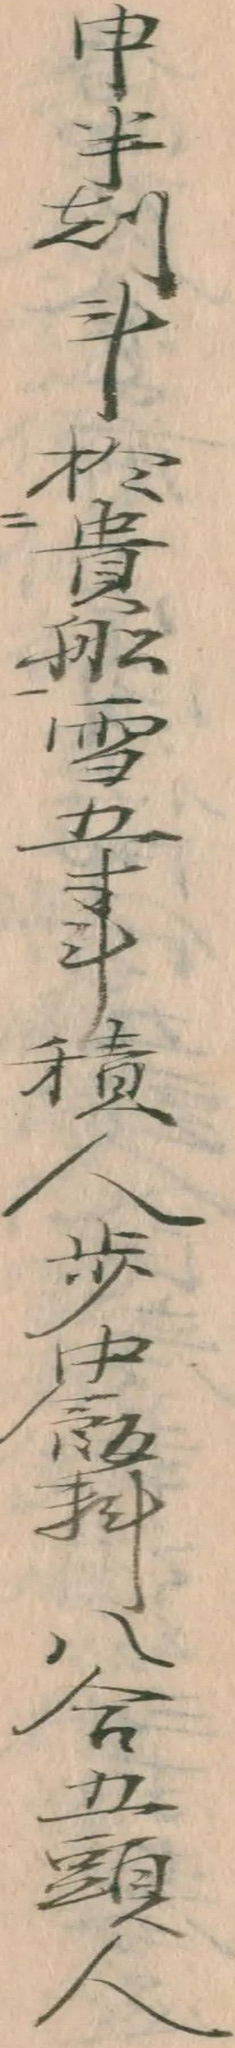申半刻斗於貴舩雪五寸斗積人歩中飯料八合五頭人
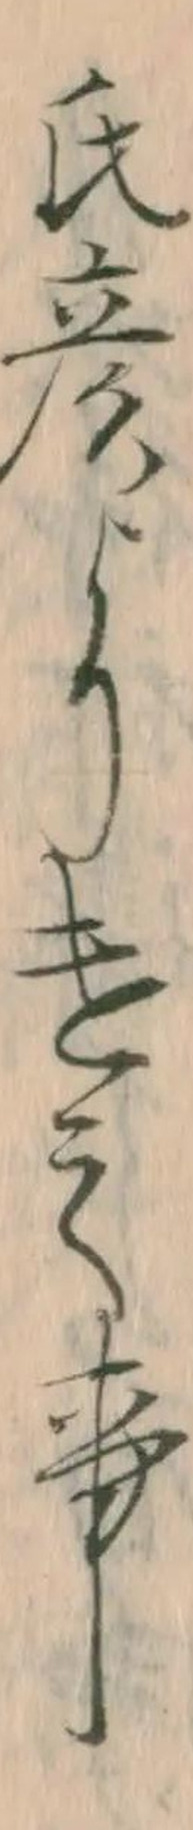氏彦より遣之事
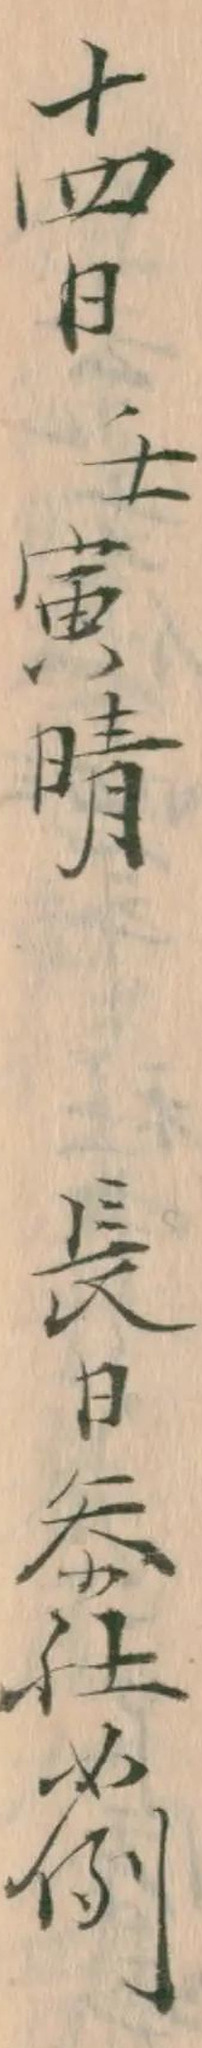十四日壬寅晴長日参社如例
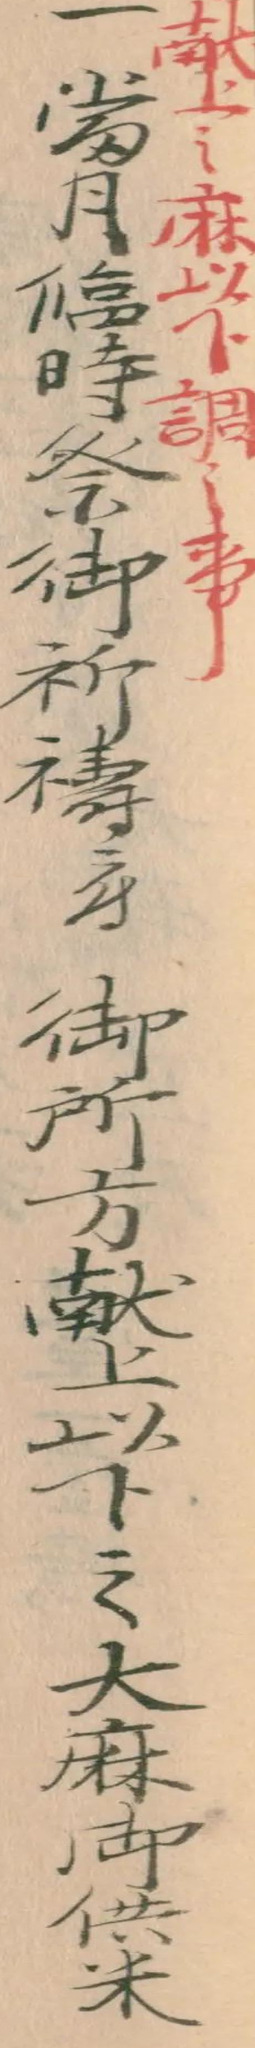一當月臨時祭御祈祷ニ付御所方献上以下之大麻御供米
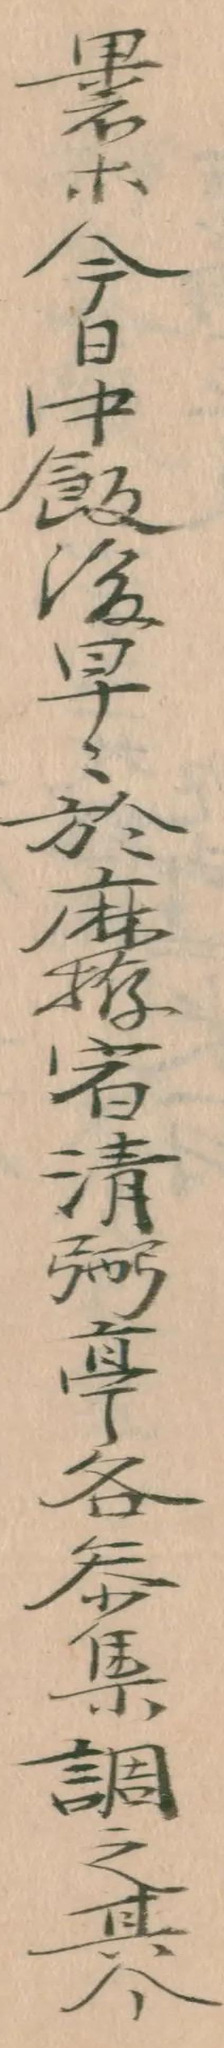褁等今日中飯後早々於麻拵宿清直弼亭各参集調之其今
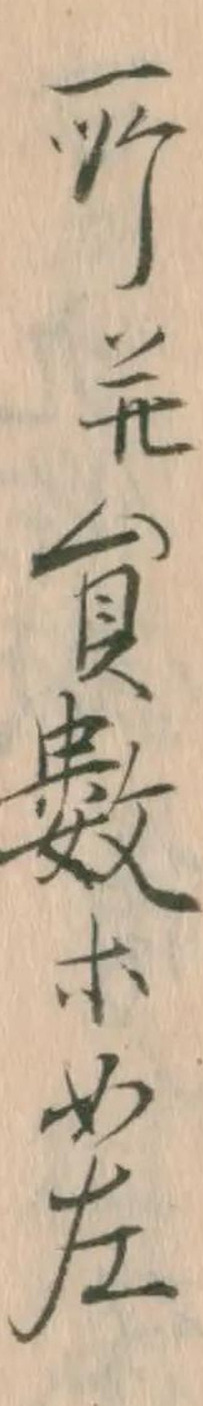所幷員数等如左
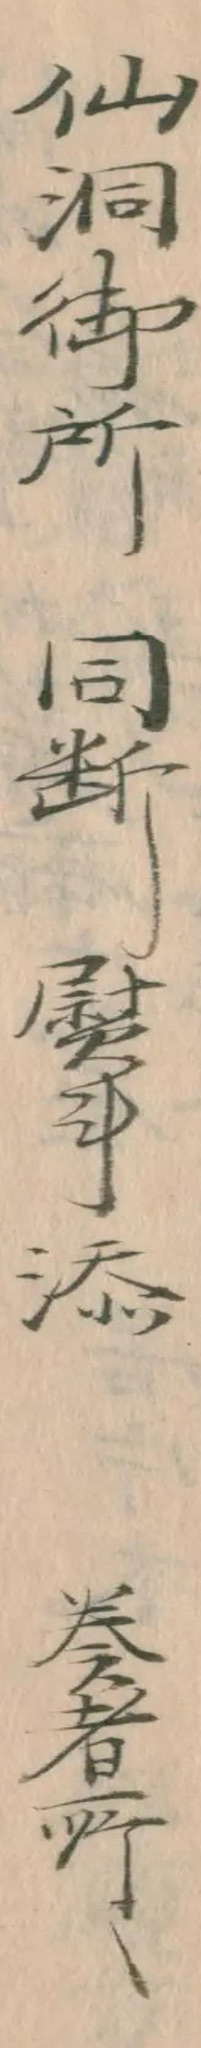仙洞御所同断熨斗添奏者所へ
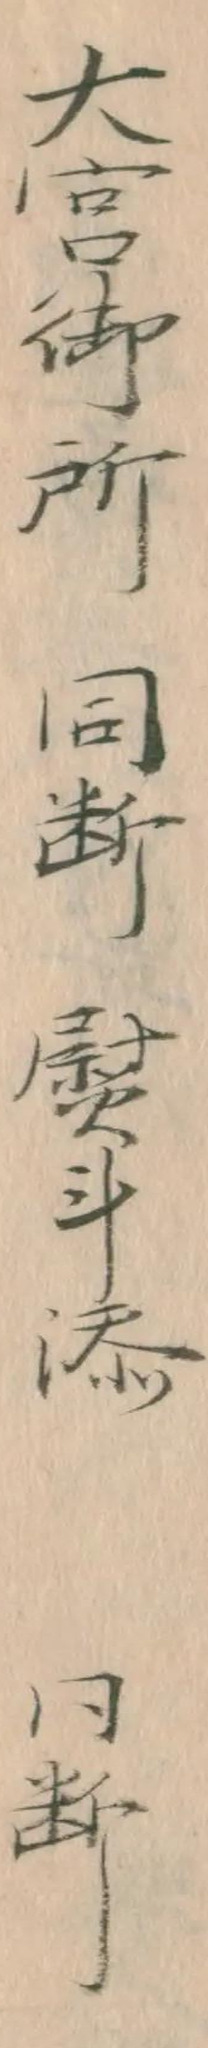大宮御所同断熨斗添同断

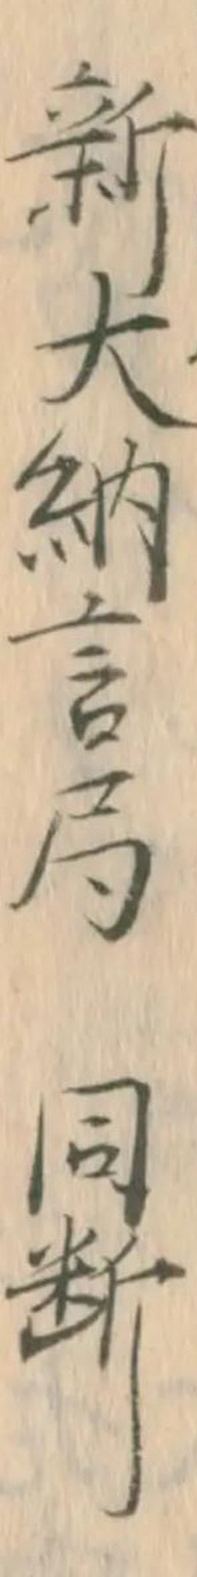權中納言局同断
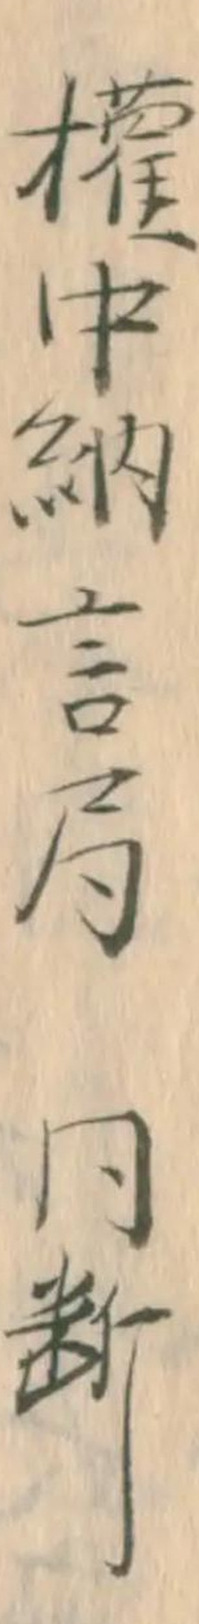權中納言局同断
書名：賀茂社記録. 第74冊
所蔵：国立国会図書館 National Diet Library, JAPAN
